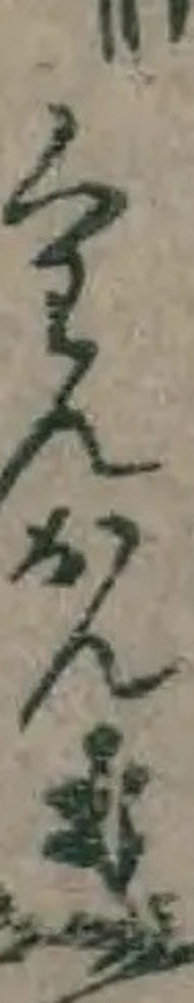くわんおん
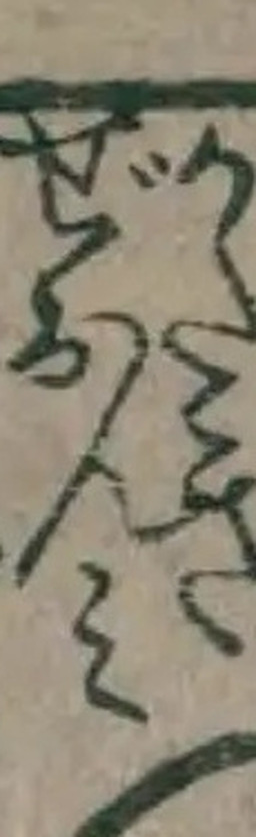ぜおんみ
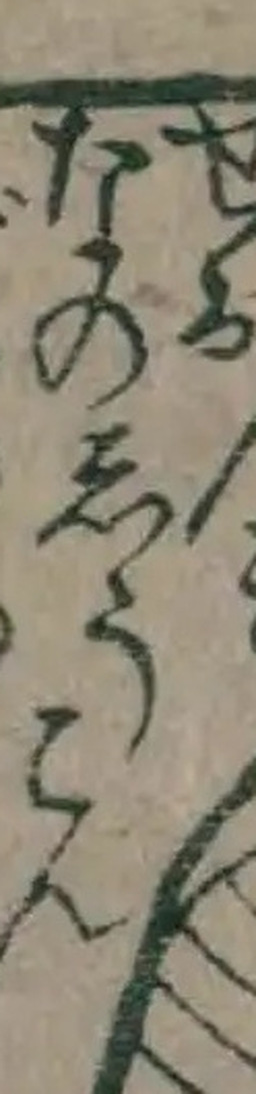なのしうこん
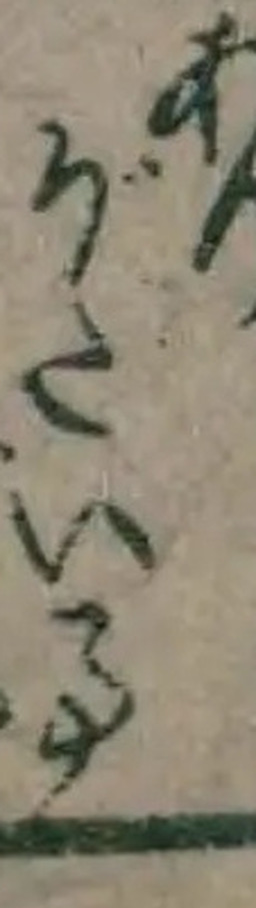がたい事
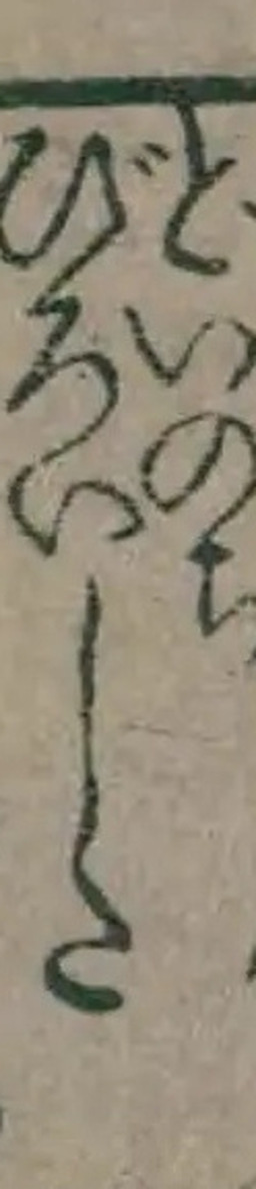びろいした
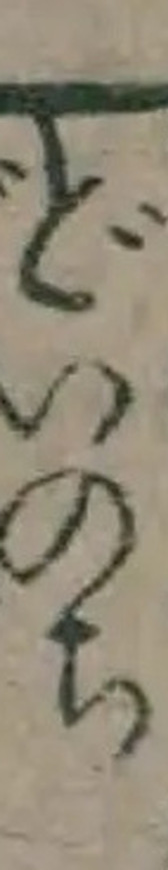どいのち
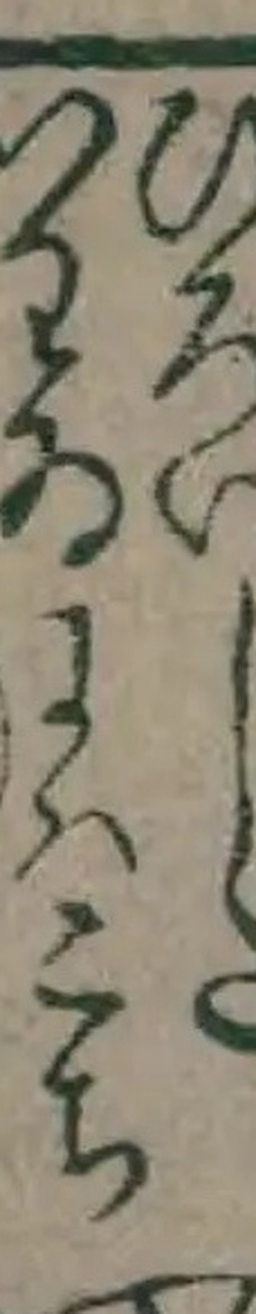いわゐにはこち
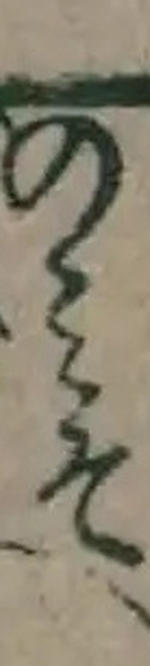のみそ
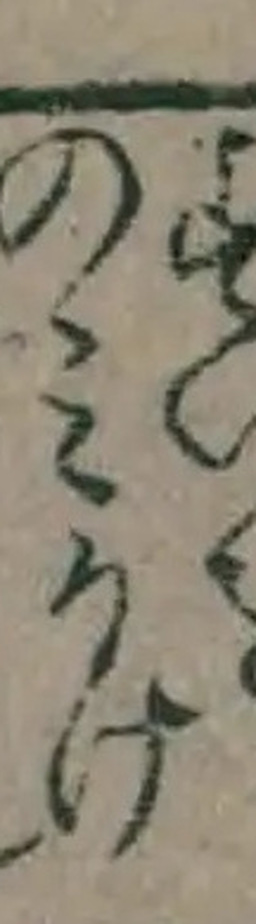のみかけ
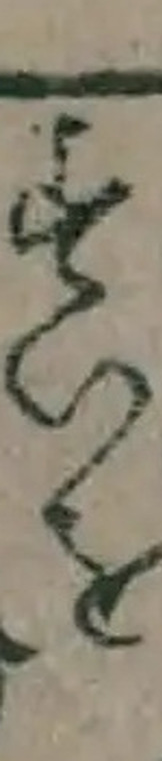すいを
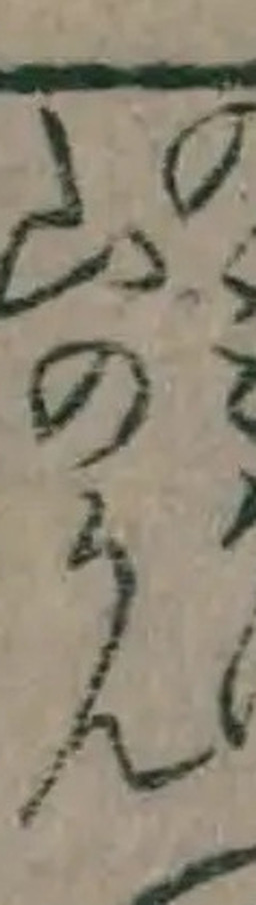山のかん
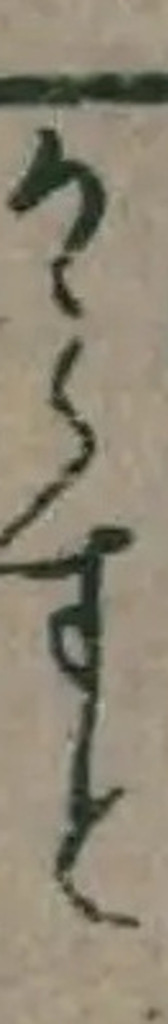からすと
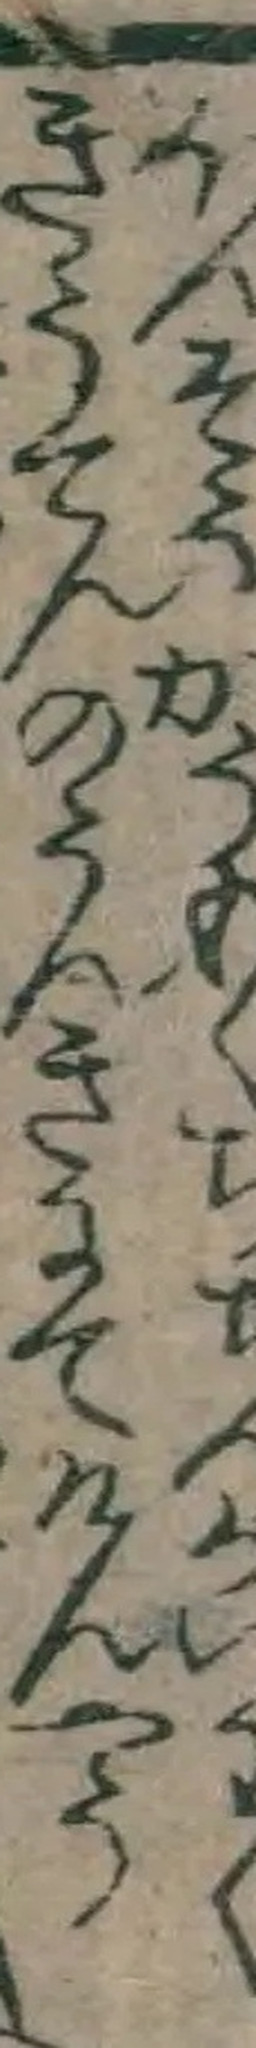きうてんのうんきにてけんやう
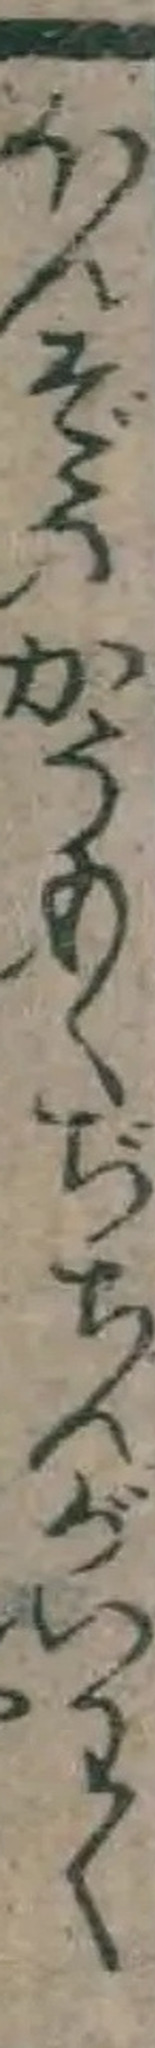ほんぞうかうもくぢちんがいわく
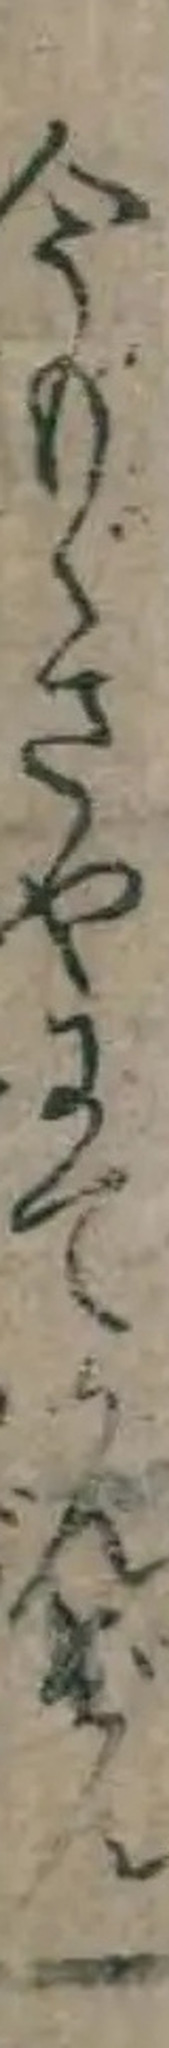今もくさやにてかんばん
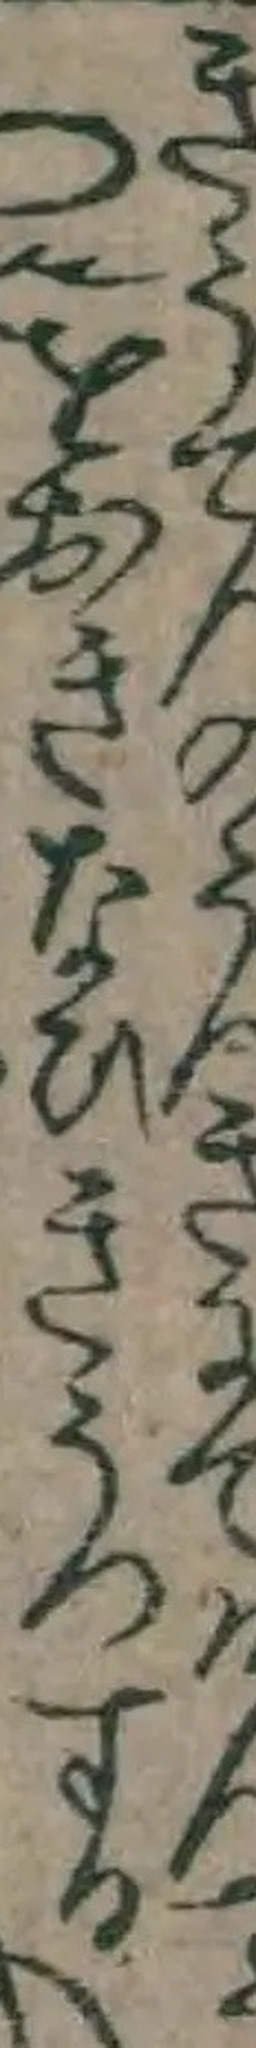をおきなひきうつする
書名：団十郎蓬芥伝
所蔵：国立国会図書館 National Diet Library, JAPAN
